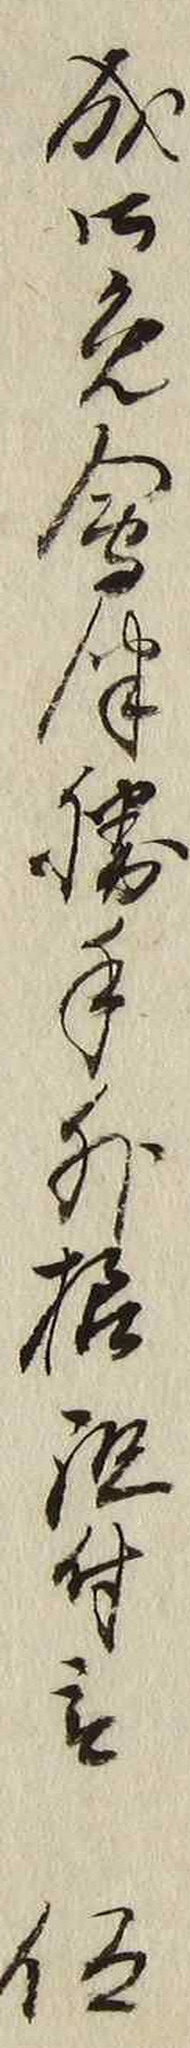成御免会津勝手外様組付被仰
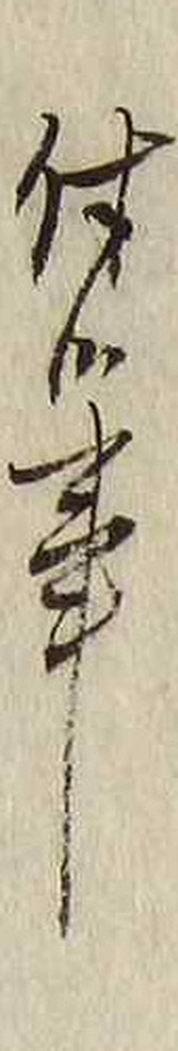付候事
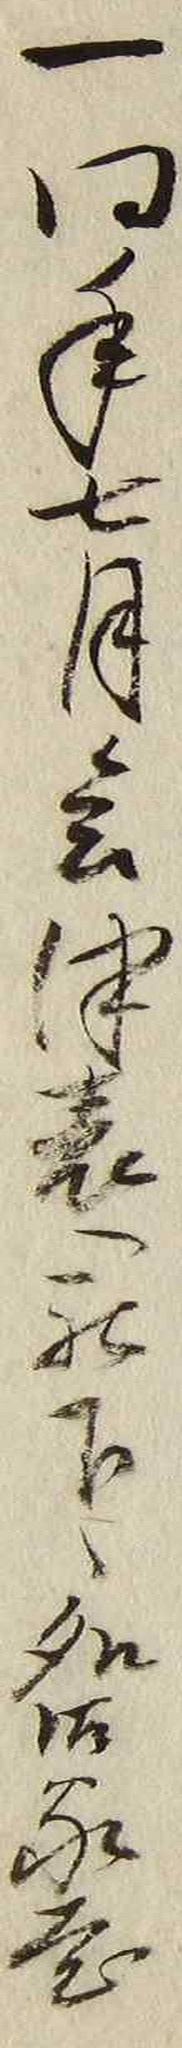一同年七月会津表へ罷下候処御家老

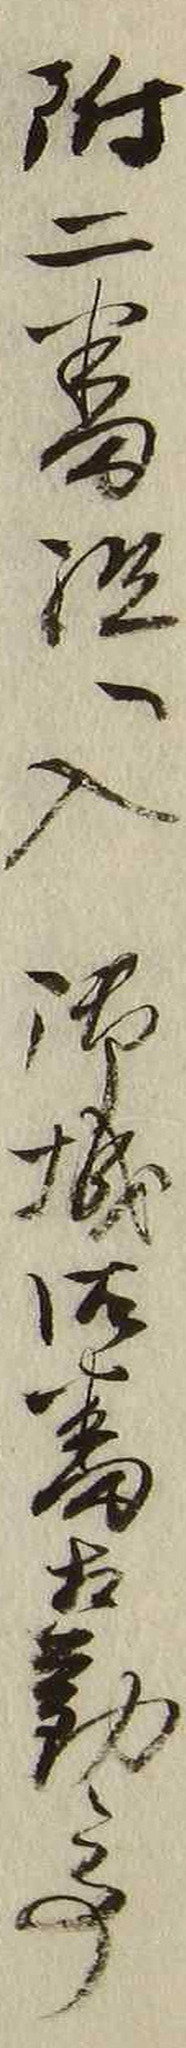附二番組へ入御城御番相勤候事
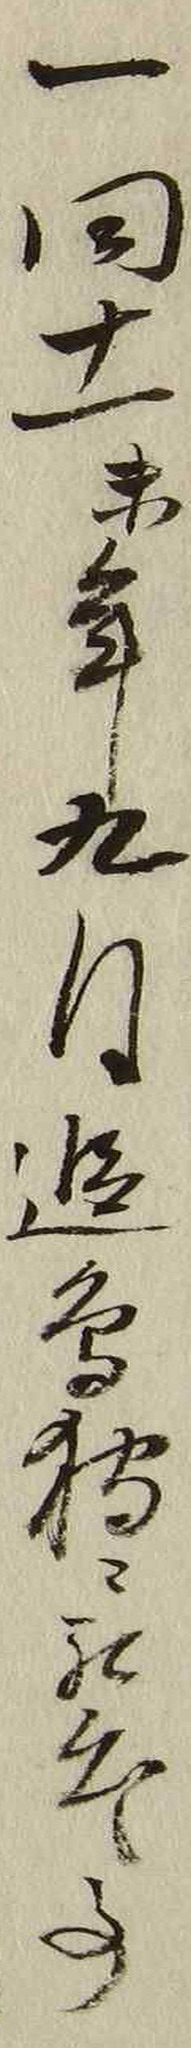一同十一未年九月追鳥狩ニ被出候事
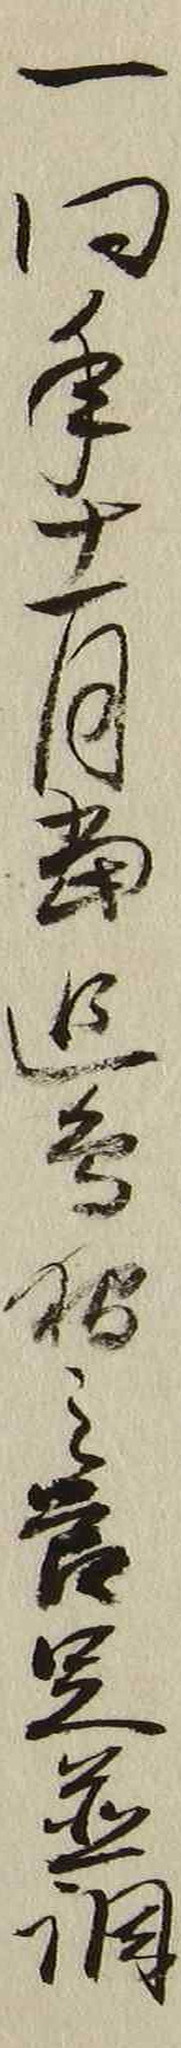一同年十一月当追鳥狩之節足並調
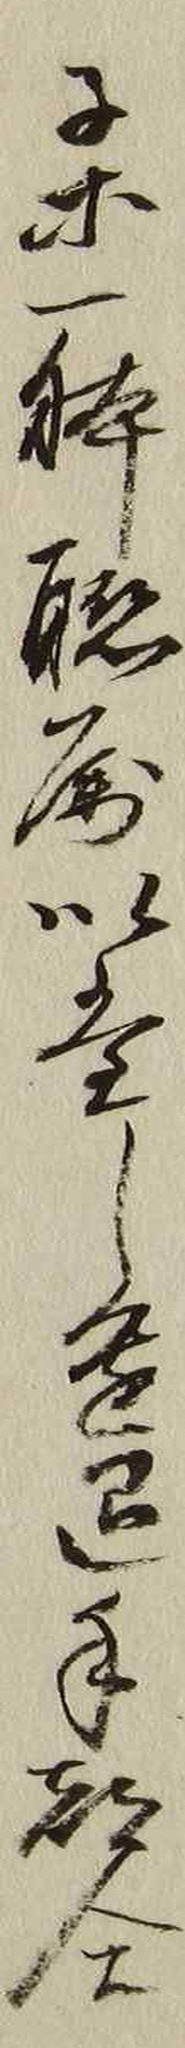子等一躰聯属いたし進退手都合
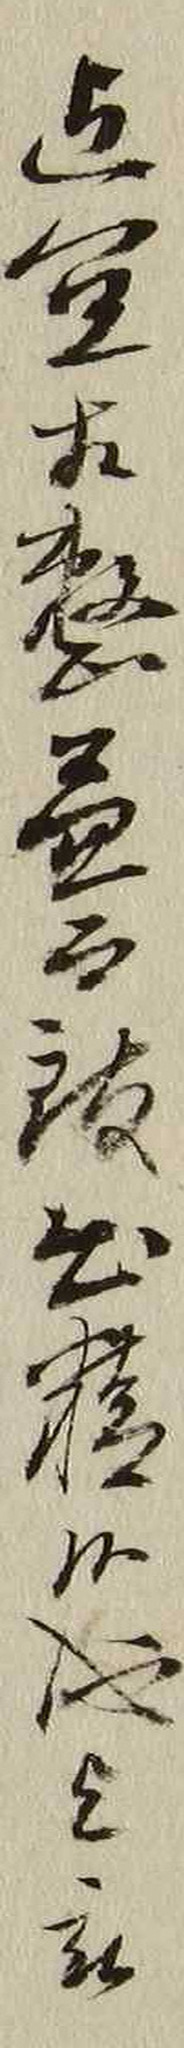迄宜相整兼而致出精候儀与被
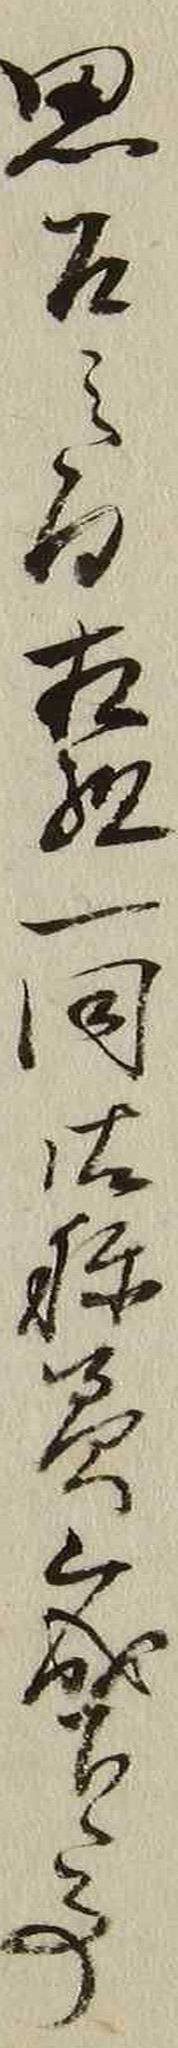思召之旨相組一同御称美被成下候事
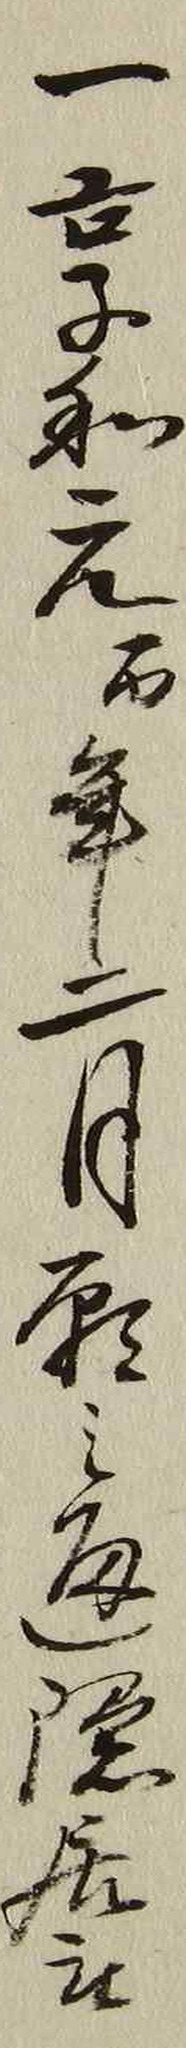一享和元酉年二月願之通隠居被
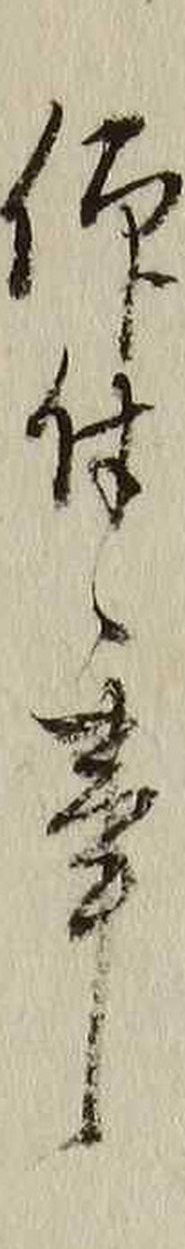仰付候事
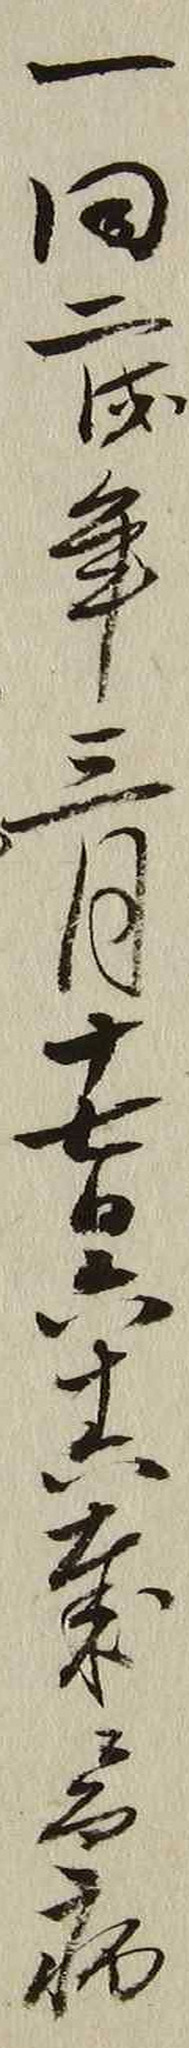一同二戌年三月十七日六十六歳ニ而病
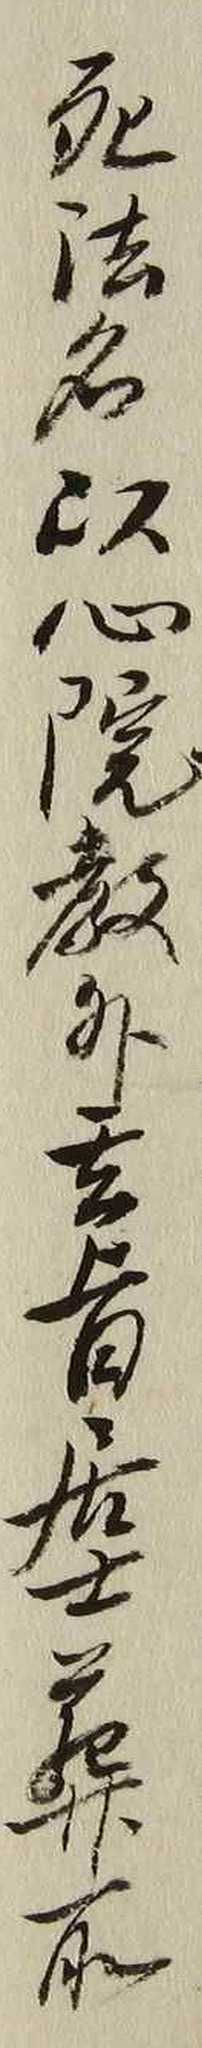死法名以心院教外玄旨居士葬所
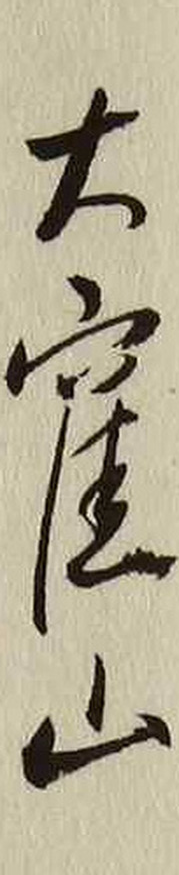大窪山
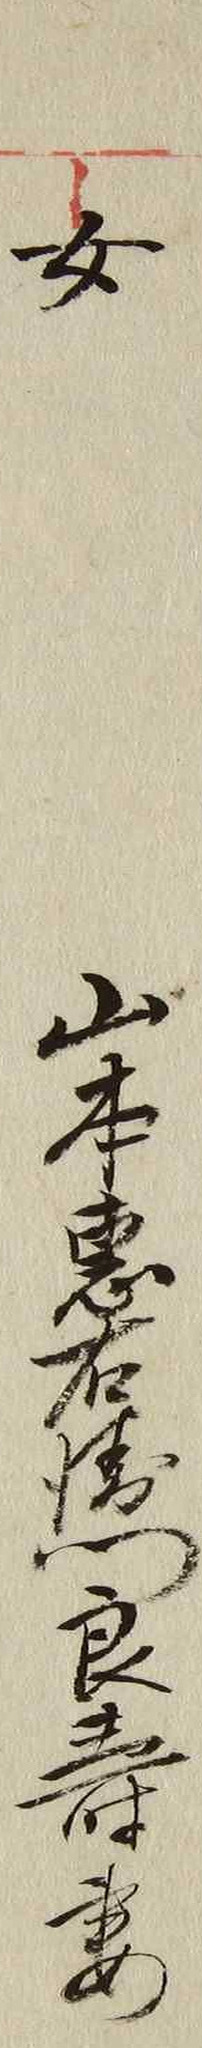女山本恵右衛門良寿妻
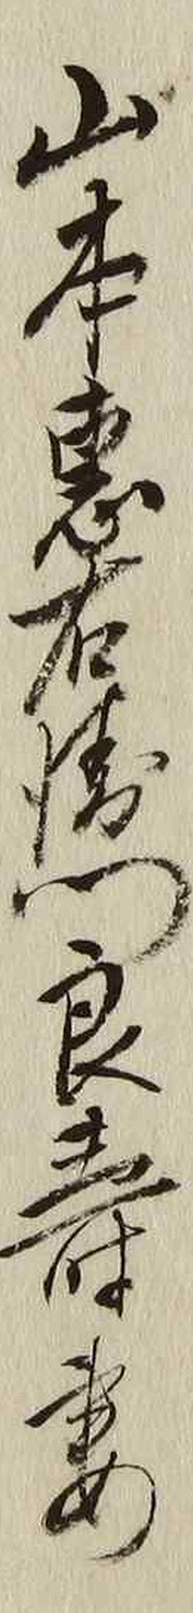女山本恵右衛門良寿妻
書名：諸士系譜　巻之352　す之部2
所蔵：会津若松市立会津図書館
